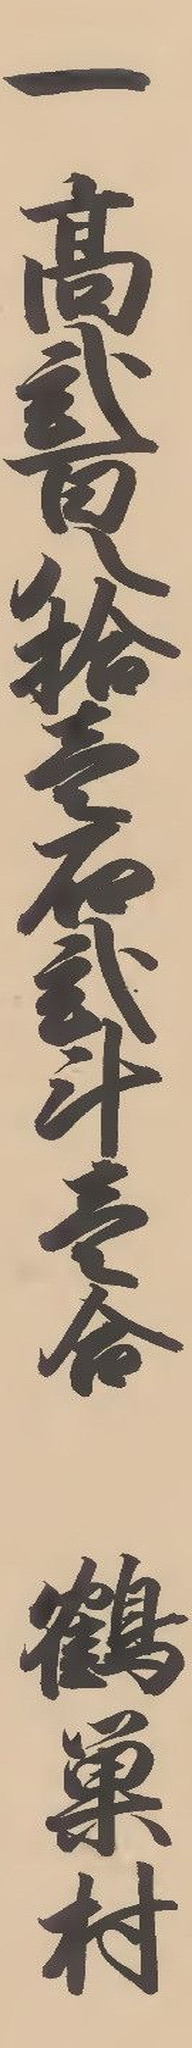一高弐百八拾壱石弐斗壱合鶴巣村
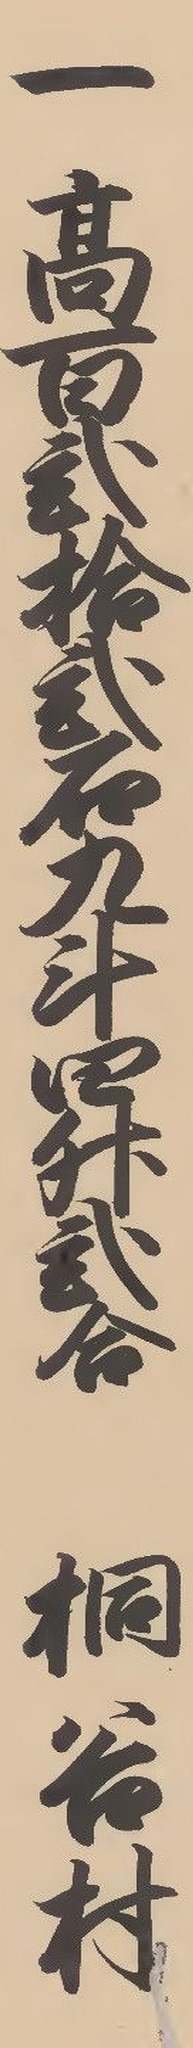一高百弐拾弐石九斗四升弐合桐谷村
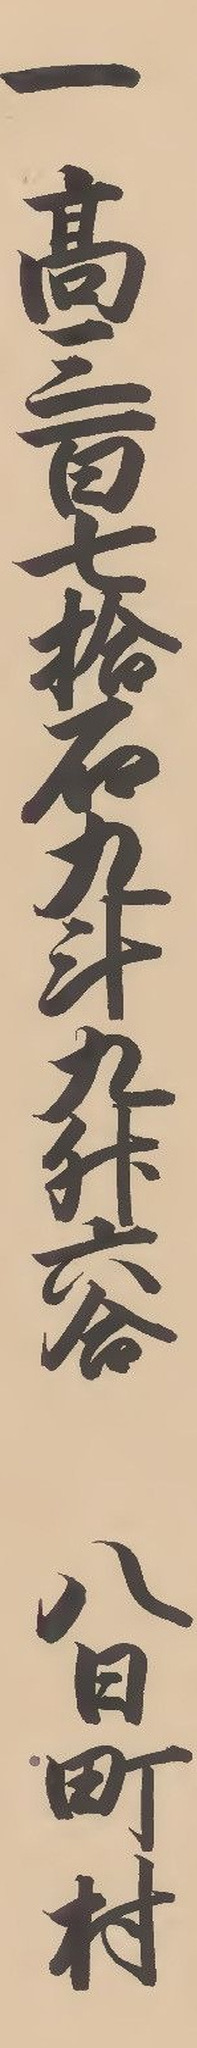一高三百七拾石九斗九升六合八日町村

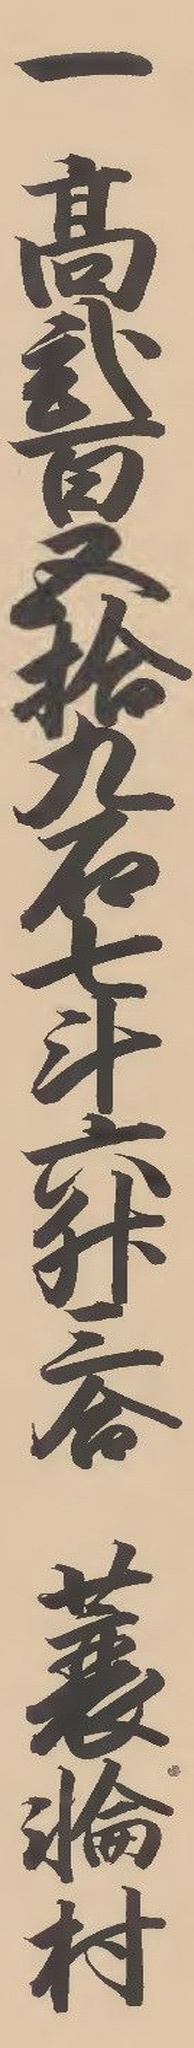一高弐百五拾九石七斗六升三合蓑輪村
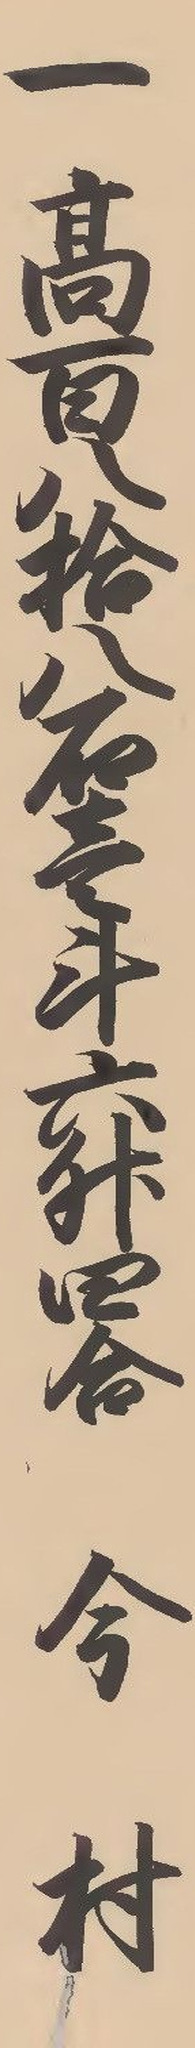一高百八拾八石壱斗六升四合今村
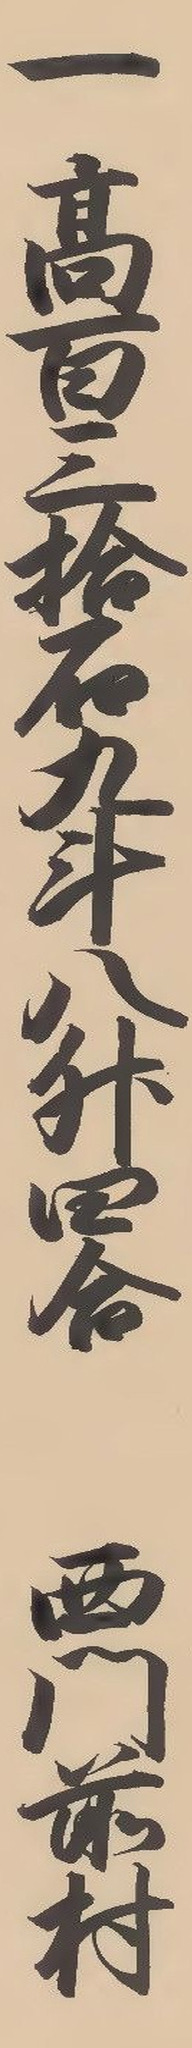一高百三拾石九斗八升四合西門前村
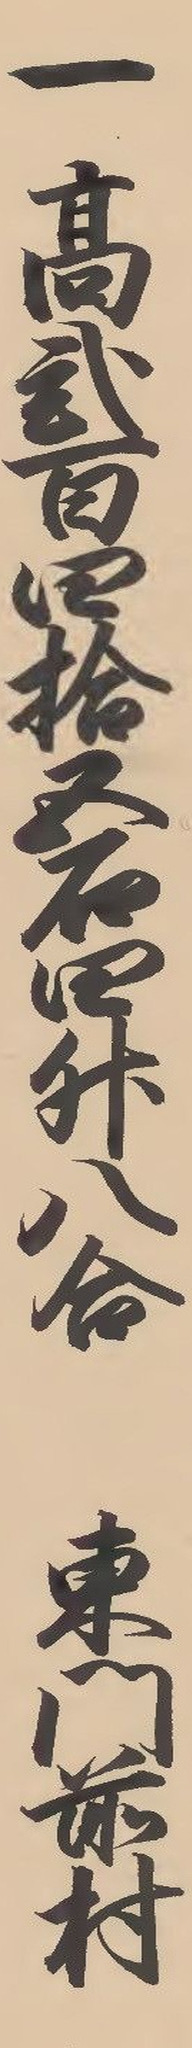一高弐百四拾五石四升八合東門前村
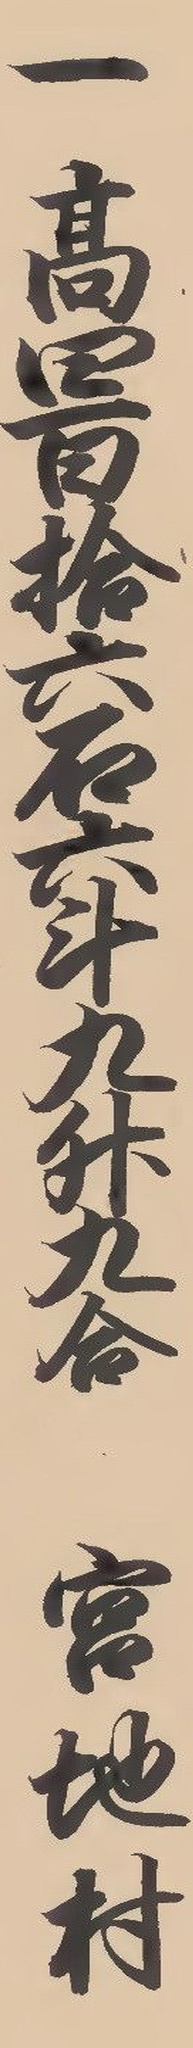一高四百拾六石六斗九升九合宮地村
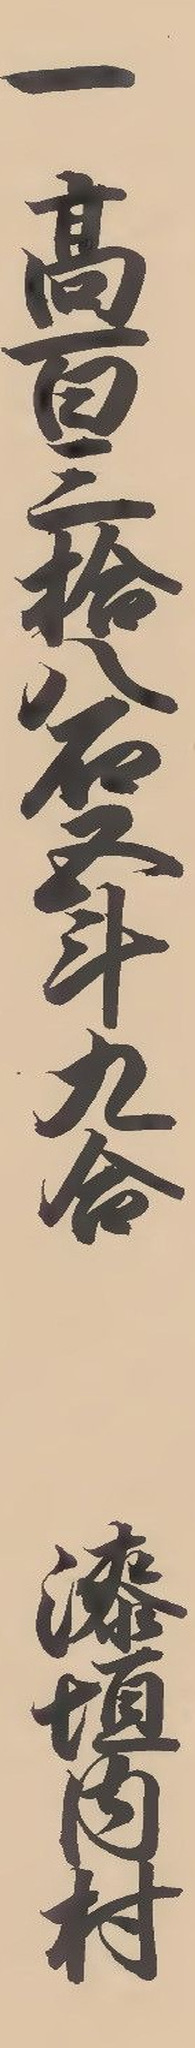一高百三拾八石五斗九合漆垣内村
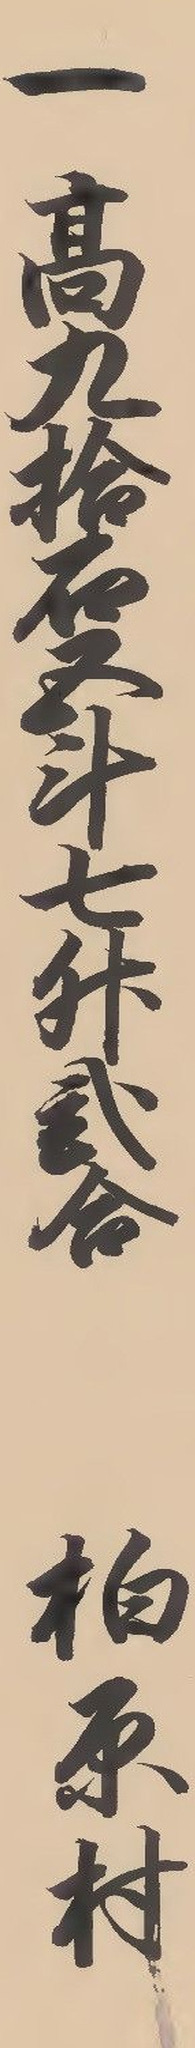一高九拾石五斗七升弐合柏原村
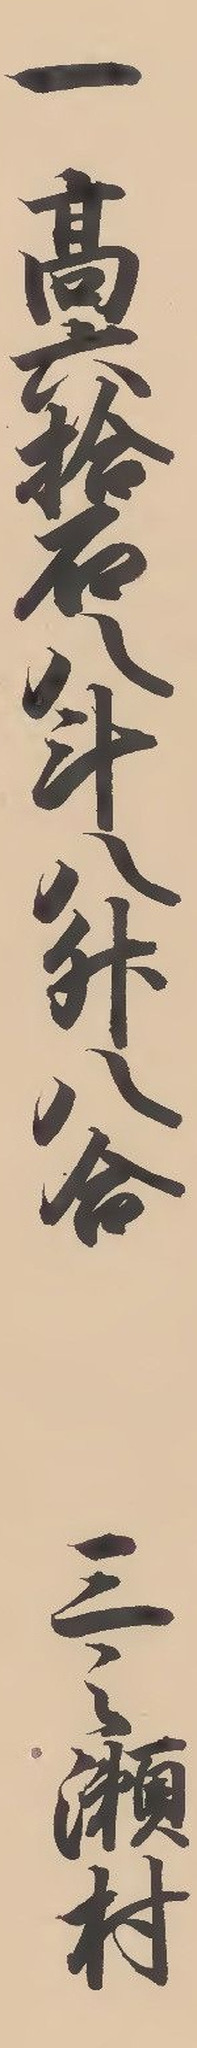一高六拾石八斗八升八合三之瀬村

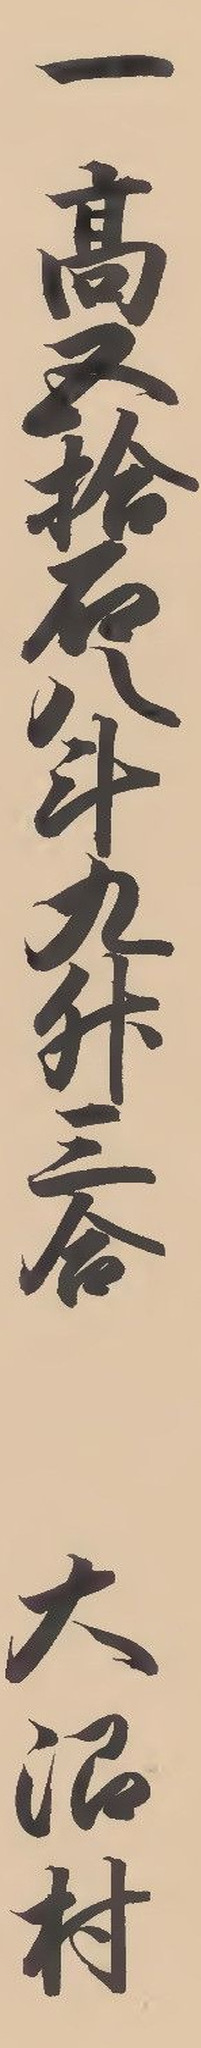一高五拾石八斗九升三合大沼村
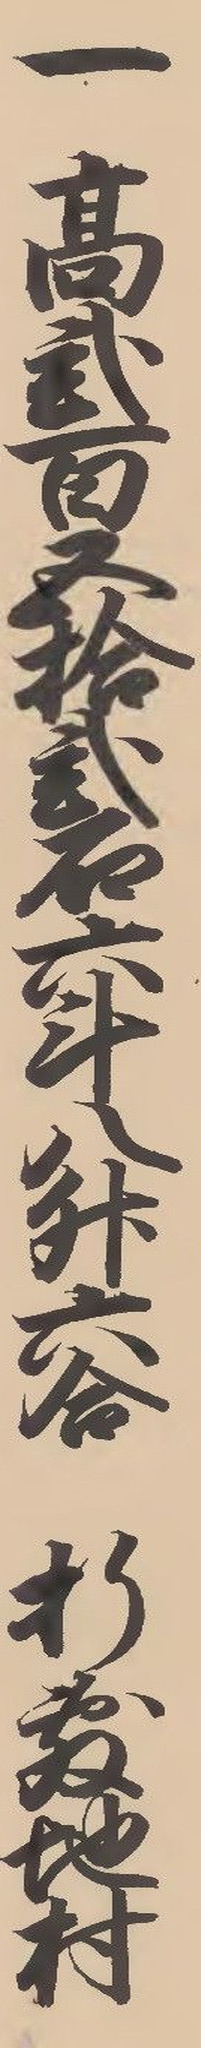一高弐百五拾弐石六斗八升六合折敷地村
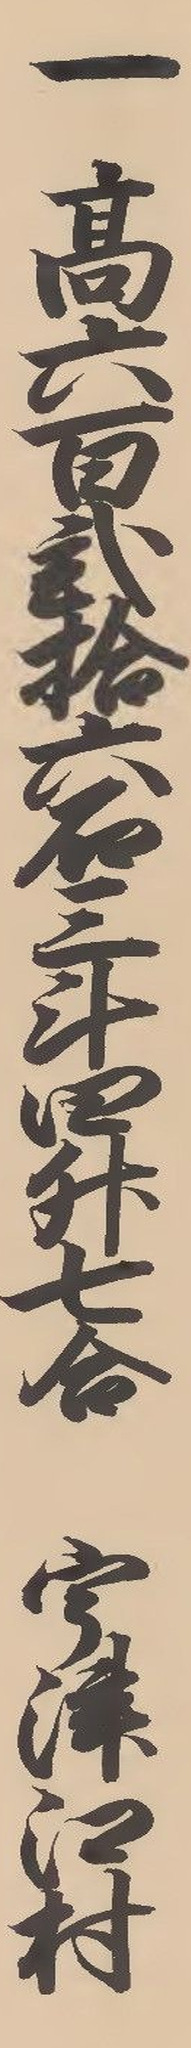一高六百弐拾六石三斗四升七合宇津江村
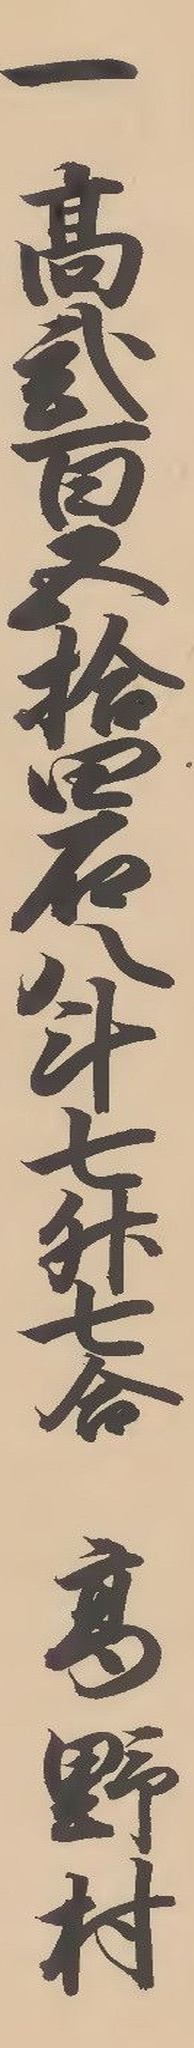一高弐百五拾四石八斗七升七合高野村
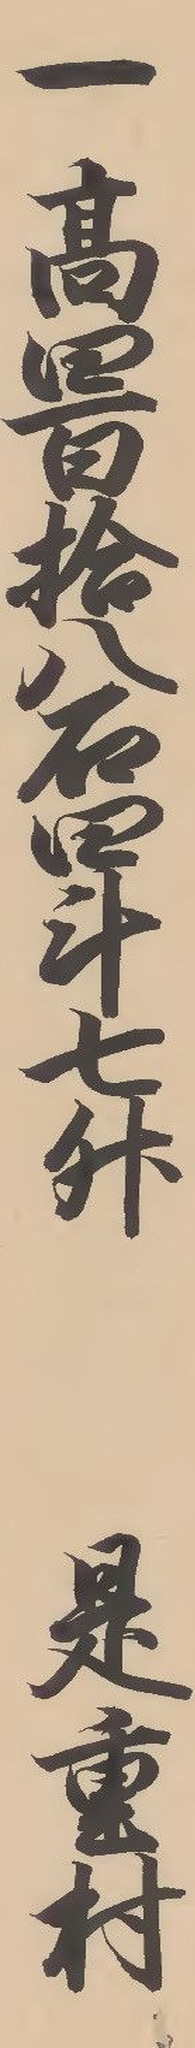一高四百拾八石四斗七升是重村
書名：飛騨国郷帳
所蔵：国立公文書館 National Archives of Japan
